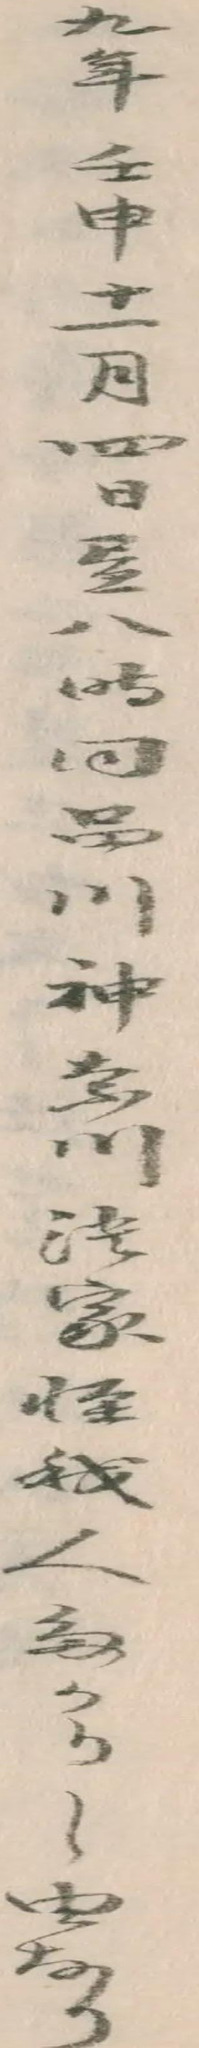九年壬申十一月四日昼八時同品川神奈川潰家怪我人多かりし由なり
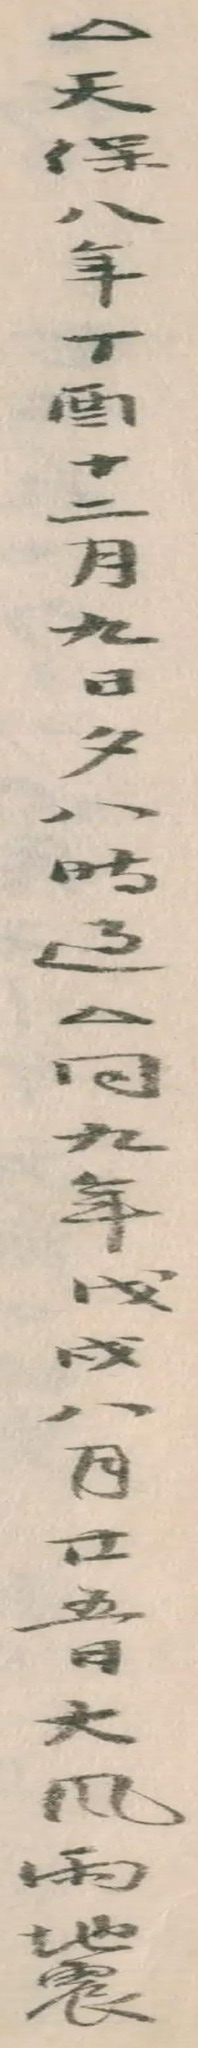△天保八年丁酉十二月九日夕八時過△同九年戊戌八月廿五日大風雨地震
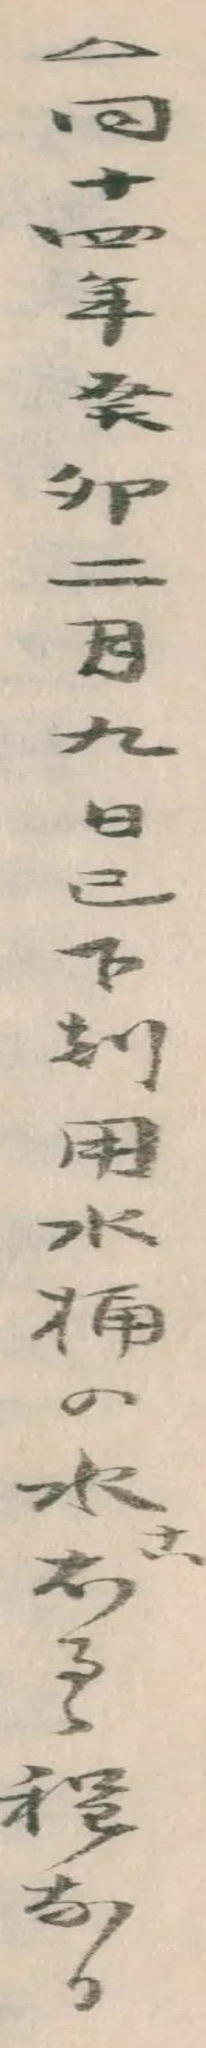△同十四年癸卯二月九日巳下刻用水桶の水こほるゝ程なり
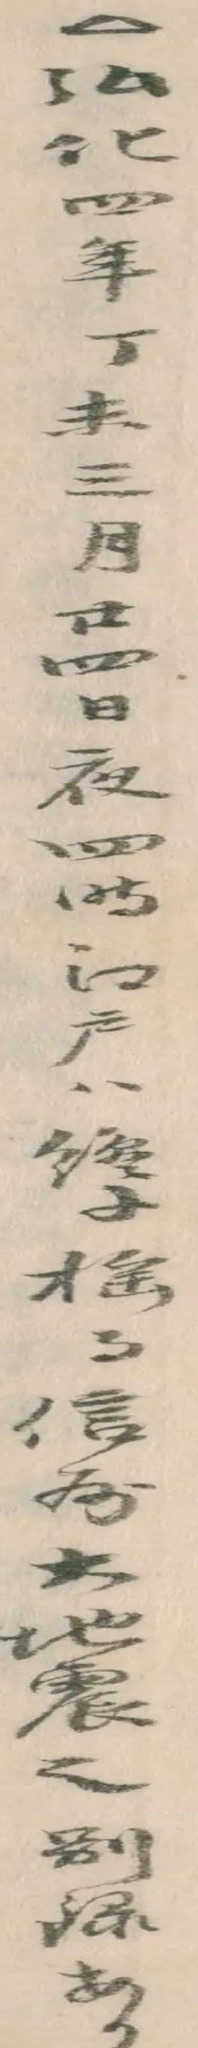△弘化四年丁未三月廿四日夜四時江戸は纔に揺る信州大地震也別録あり

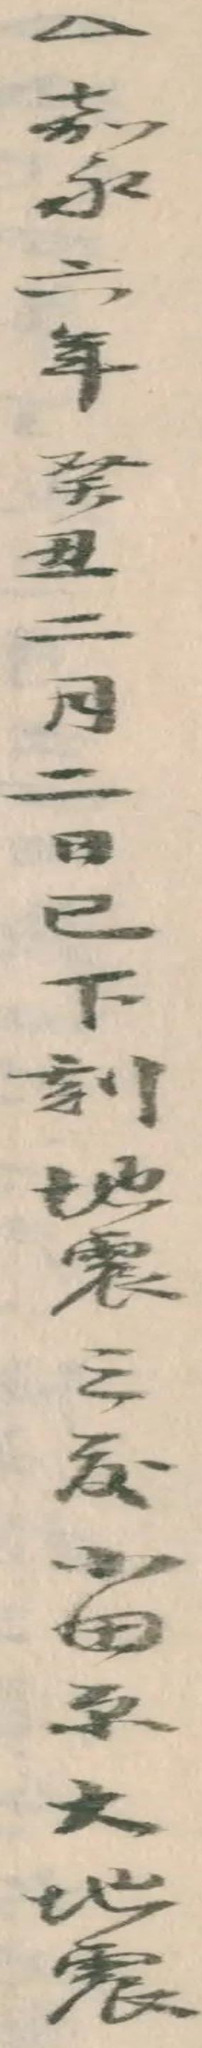△嘉永六年癸丑二月二日巳下刻地震三度小田原大地震
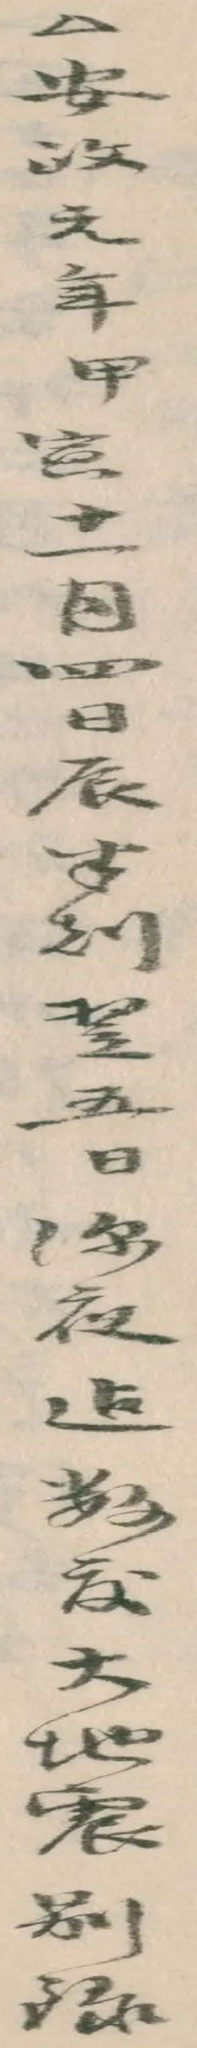△安政元年甲寅十一月四日辰半刻翌五日深夜迄数度大地震別録
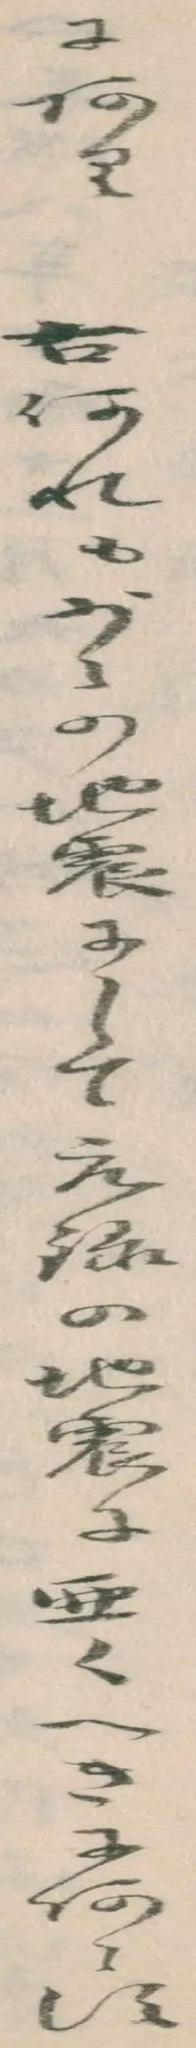にあり右何れも少々の地震にして元禄の地震に亜くへきにあらす
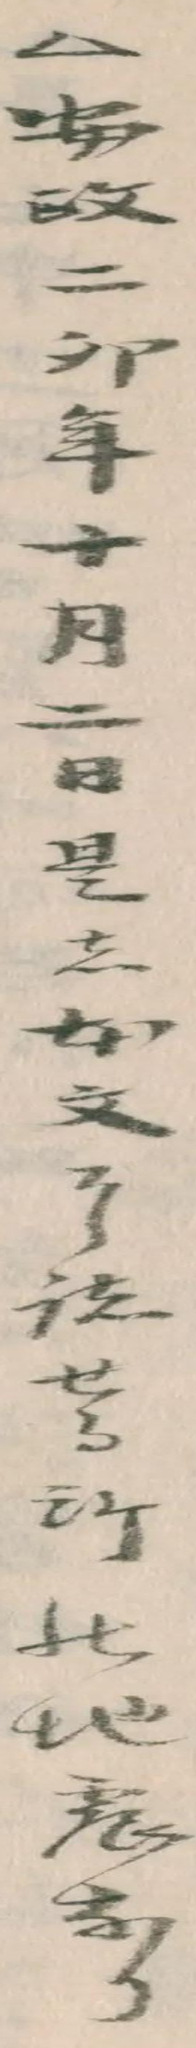△安政二卯年十月二日是は本文に誌せる所の地震なり
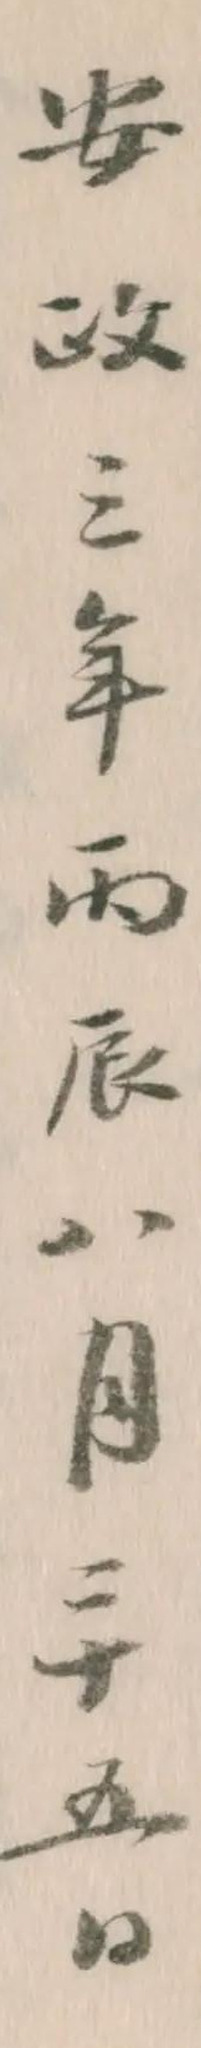安政三年丙辰八月二十五日
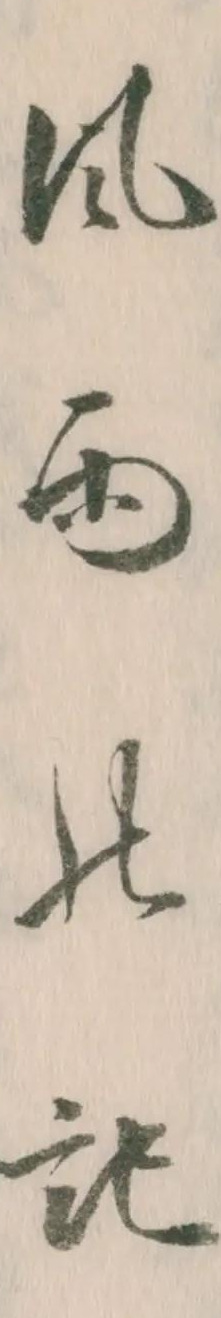風雨の記

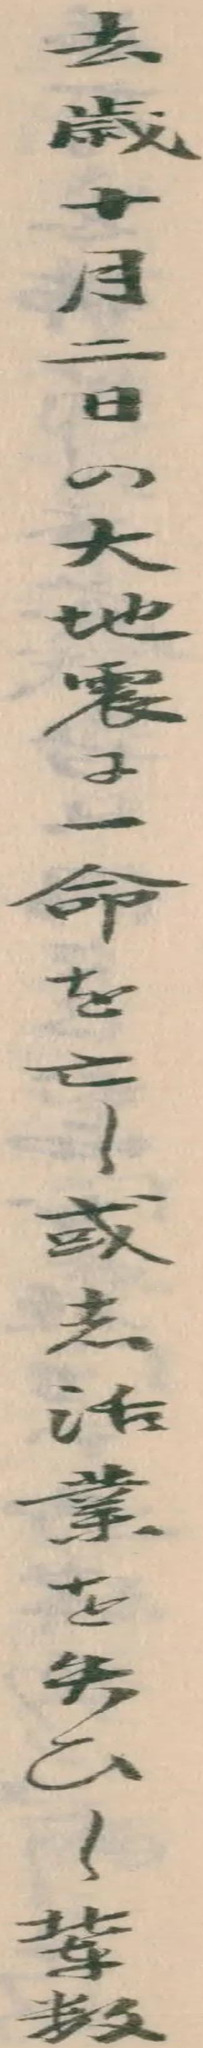去歳十月二日の大地震は一命を亡し或は活業を失ひし輩数
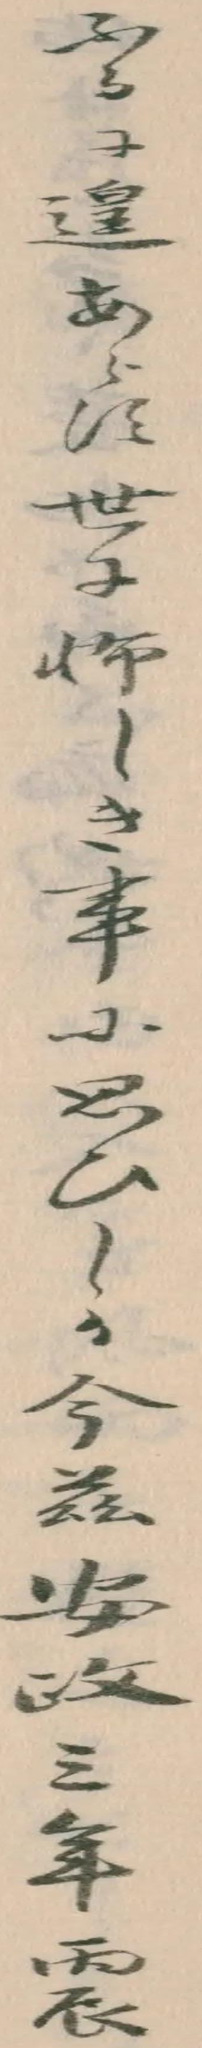ふるに遑あらす世に怖しき事に思ひしか今茲安政三年丙辰
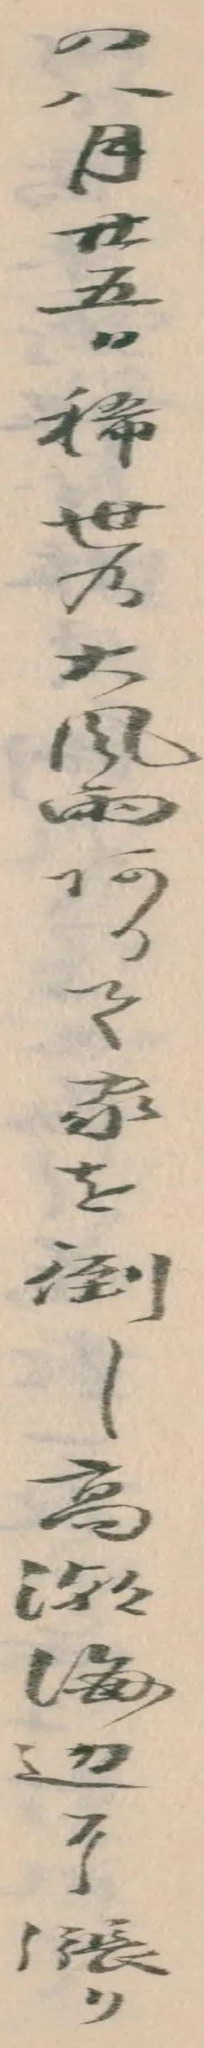の八月廿五日稀世の大風雨ありて家を倒し高潮海辺に漲り
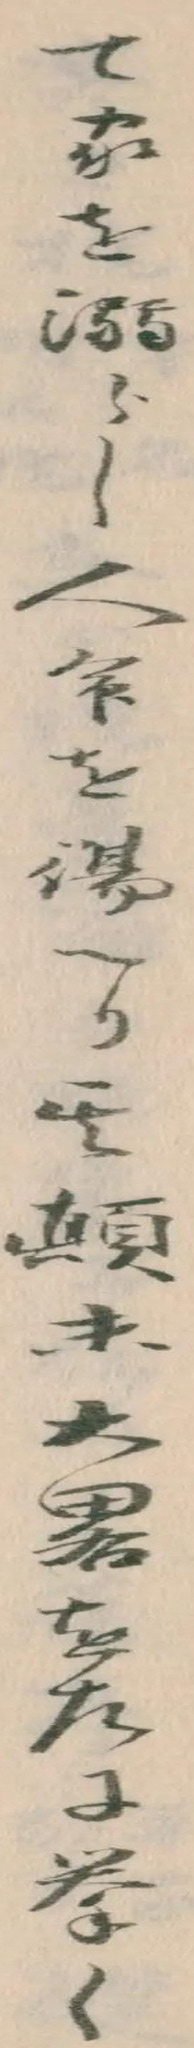て家を溺らし人命を傷へり其顛末大略を左に挙く
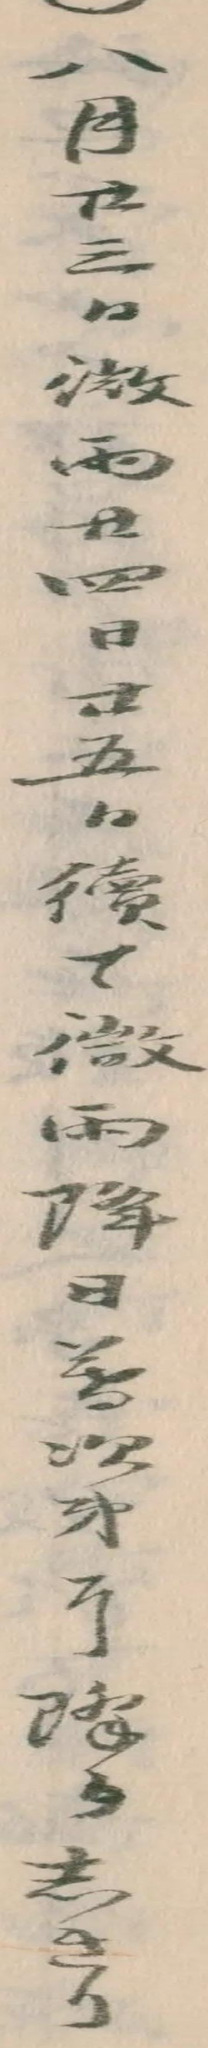〇八月廿三日微雨廿四日廿五日続て微雨降日暮次第に降りしきり
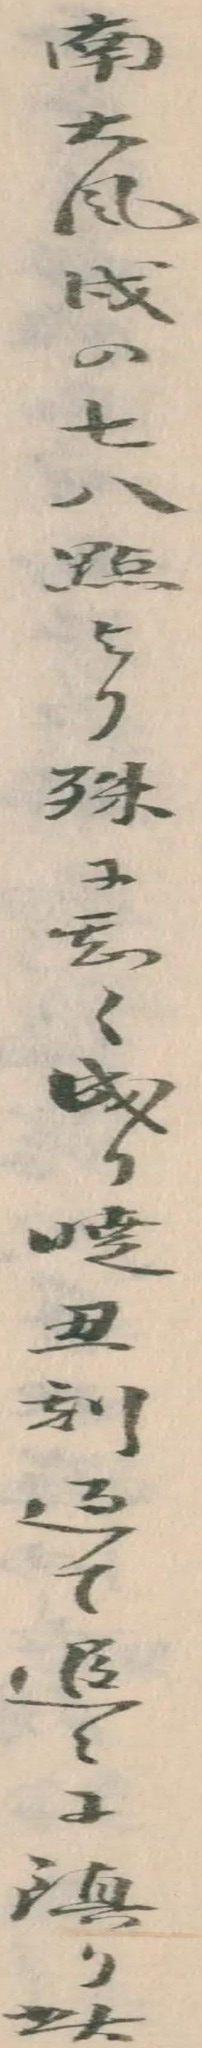南大風戊の七八点より殊に甚く成り暁丑刻過て追々に鎮り此
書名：地災撮要. 巻10(地震之部) 上,下
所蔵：国立国会図書館 National Diet Library, JAPAN
